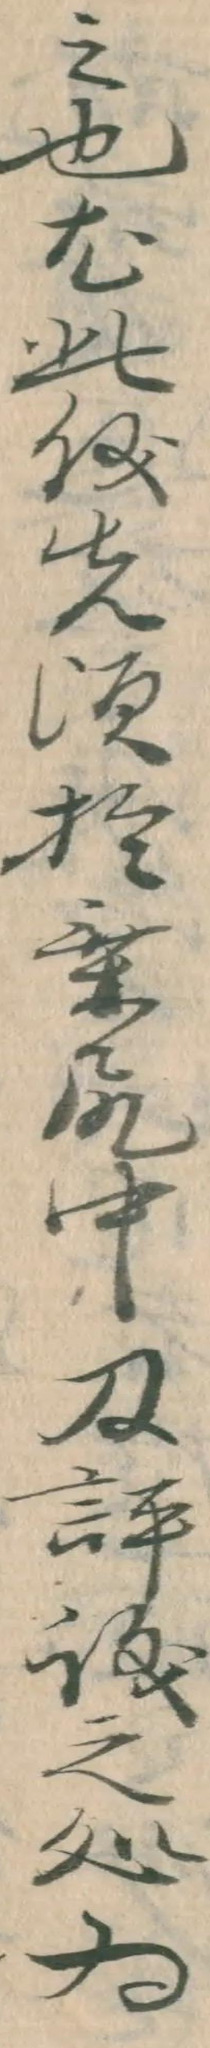之也尤此儀先頃於乗尻中及評議之処為
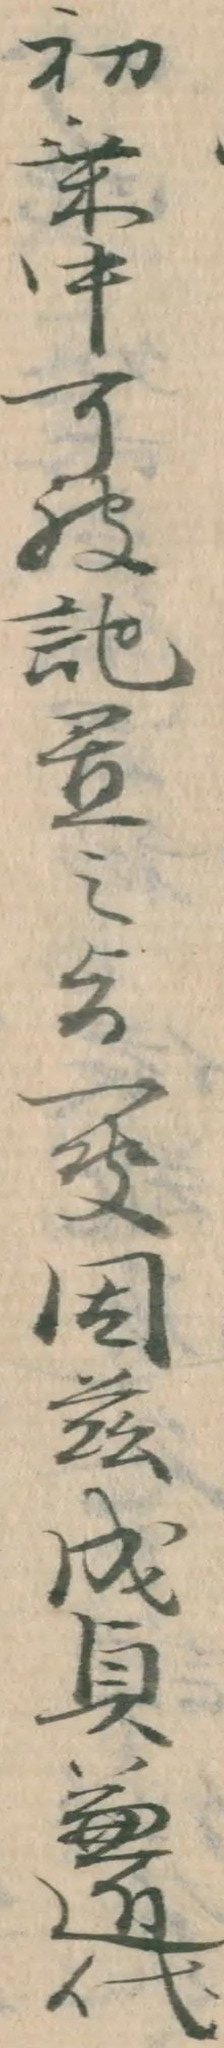初乗中可致記置之旨一決因茲成貞兼近代
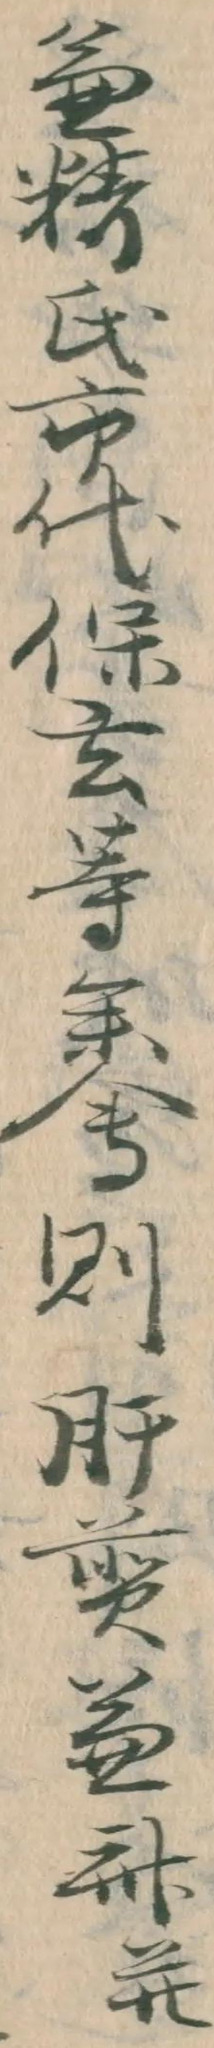兼精氏市代保玄等参会則肝煎兼斎并
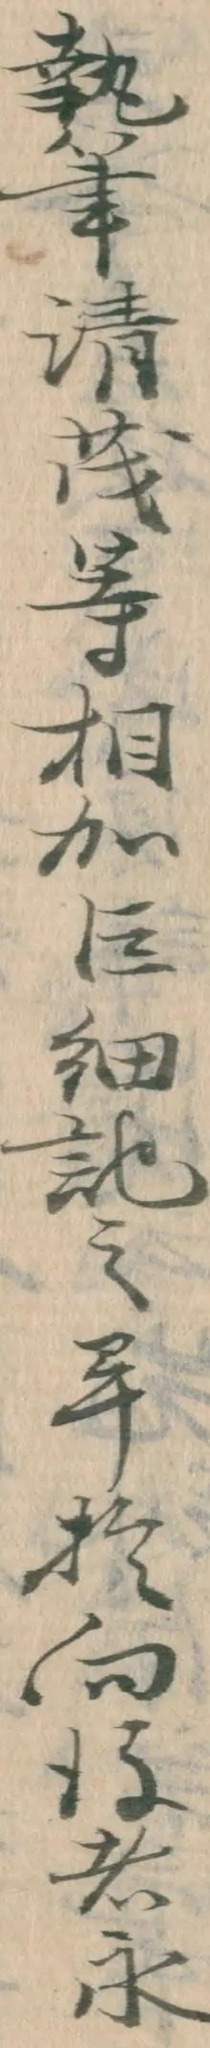執筆清茂等相加巨細記之畢於向後者永
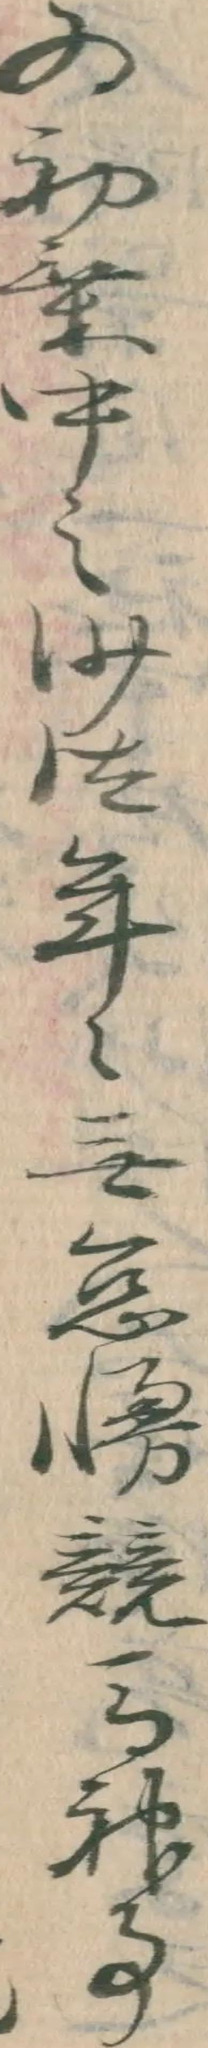為初乗中之沙汰年々無怠慢競馬神事
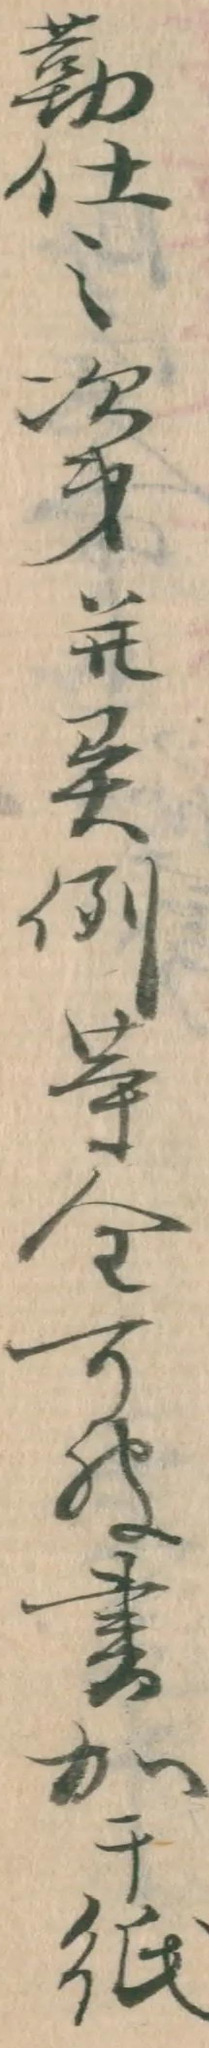勤仕之次第并異例等全可被書加于紙
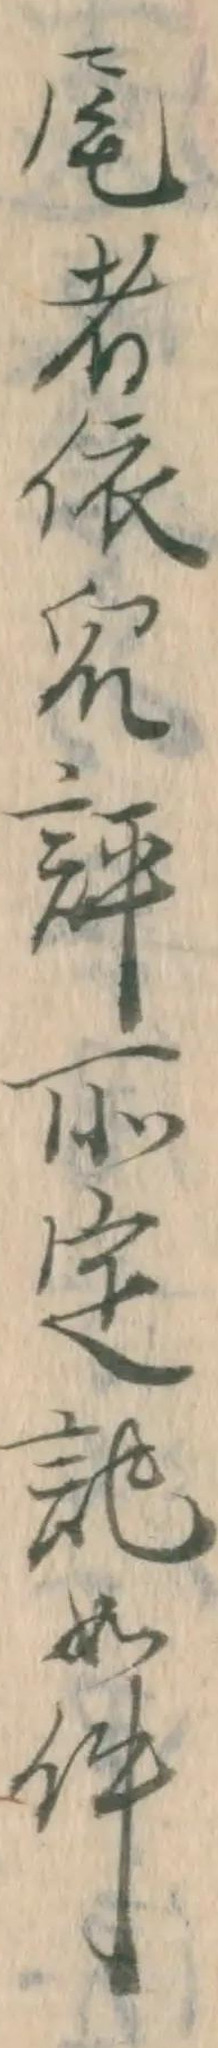尾者依衆評所定記如件
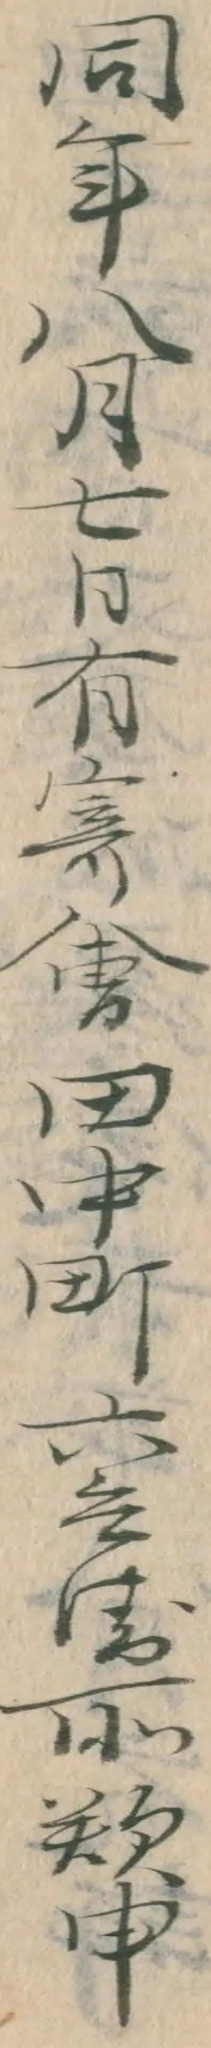同年八月七日有寄会田中町六兵衛所歎欲申
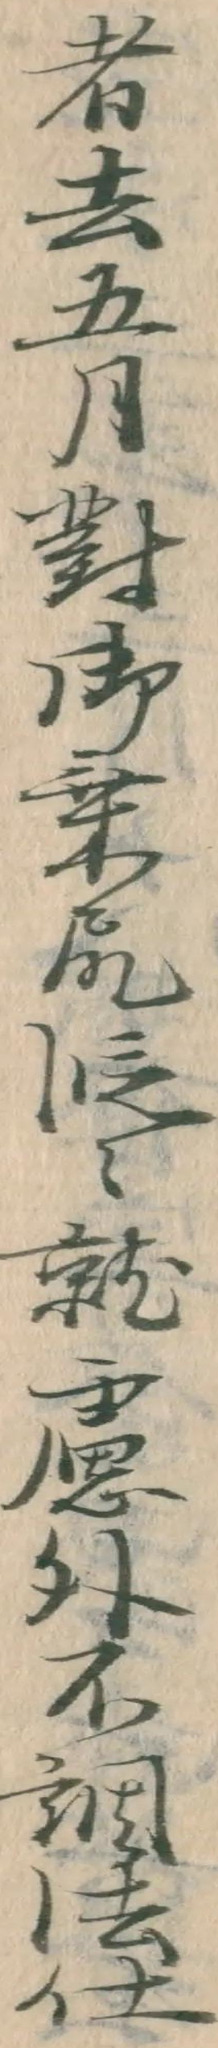者去五月対御乗尻段々就慮外不調法仕
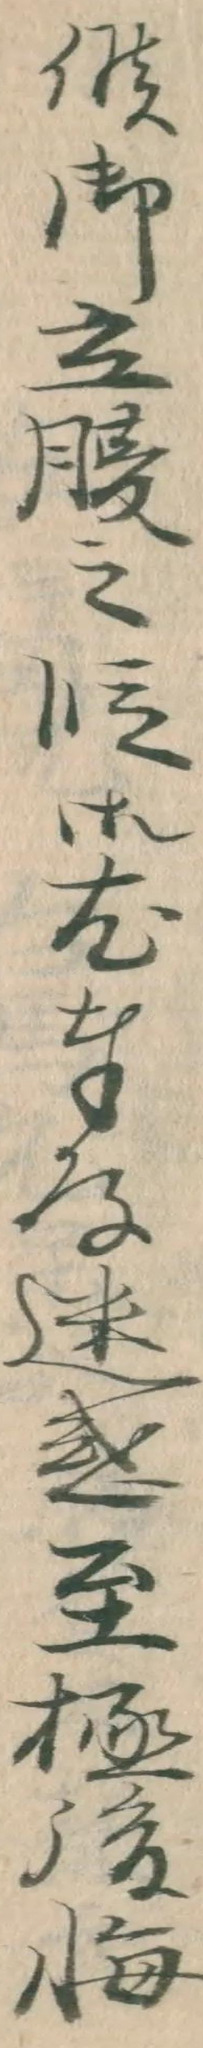候御立腹之段御尤奉存迷惑至極後悔
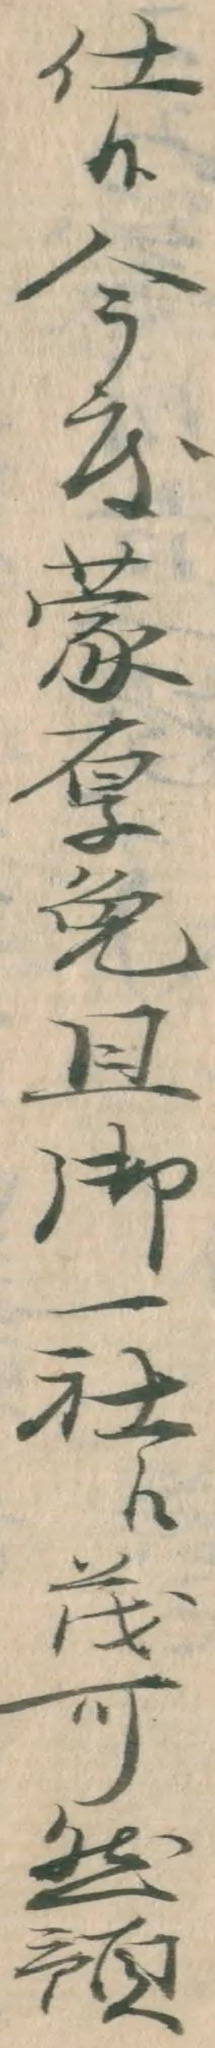仕候今度蒙厚免且御一社江茂可然預
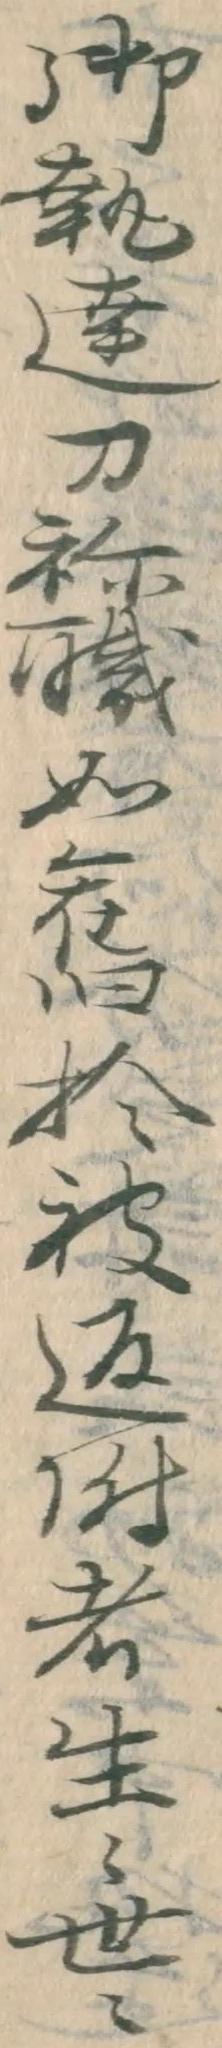御執達刀祢職如旧於被返附者生々世々
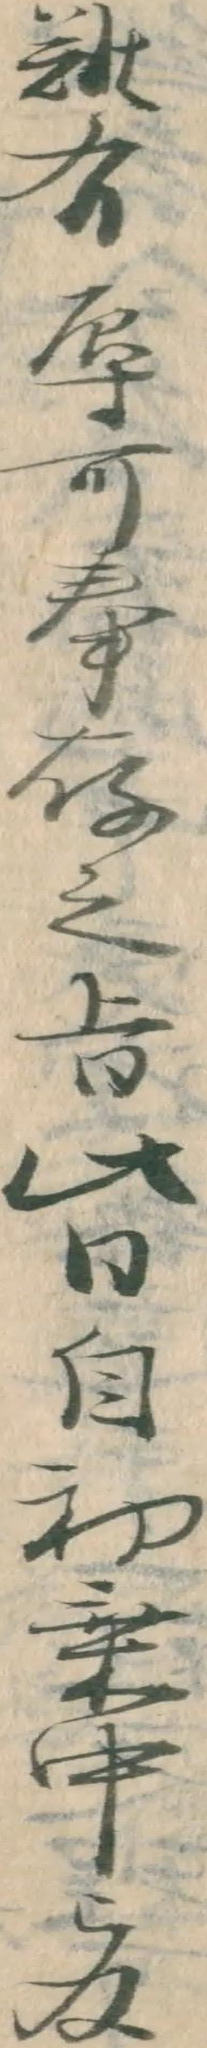難有辱可奉存之旨此日自初乗中被及
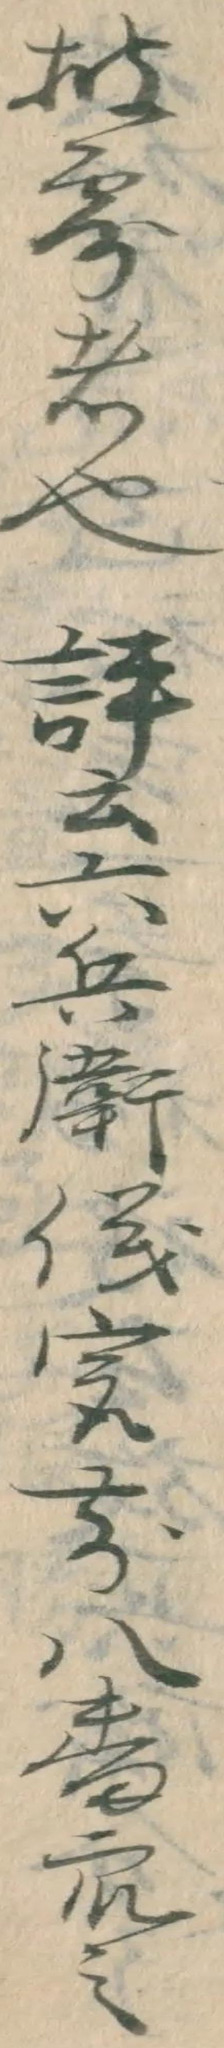披露者也評云六兵衛儀最前八番衆之
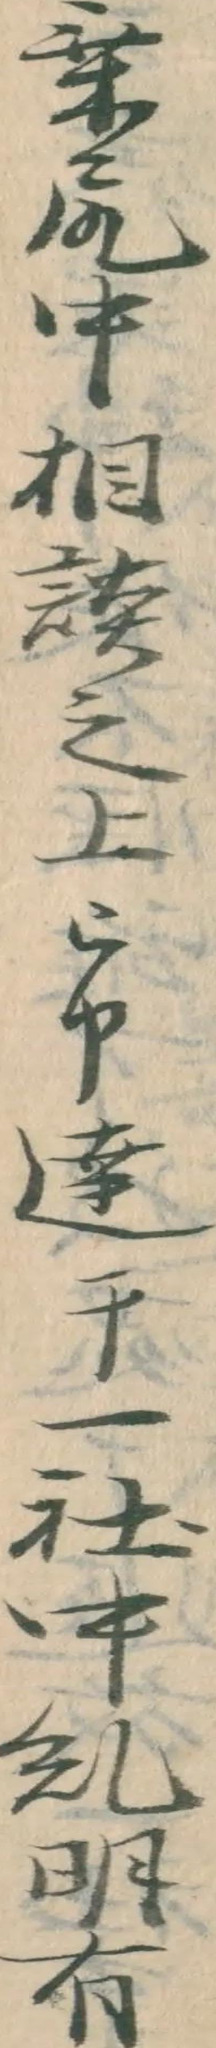乗尻中相談之上被申達于一社中糺明有

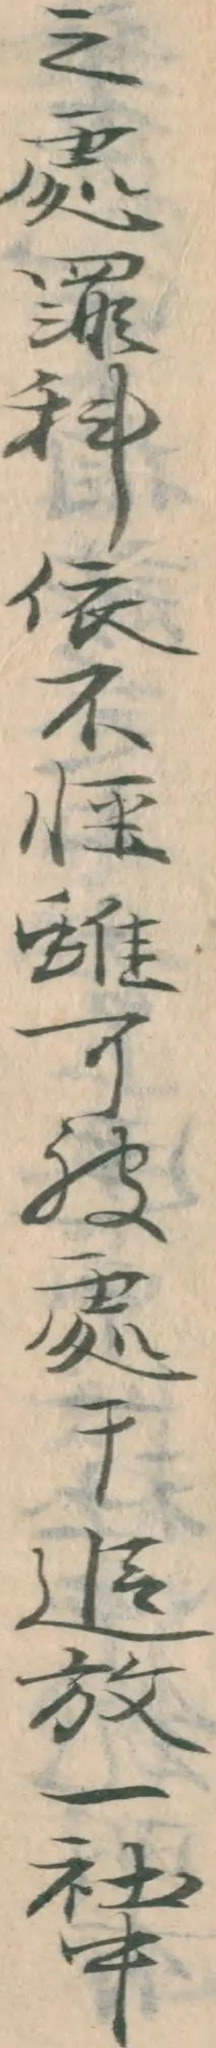之処罪科依不軽雖可致処于追放一社中
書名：賀茂社記録. 第10冊
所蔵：国立国会図書館 National Diet Library, JAPAN
